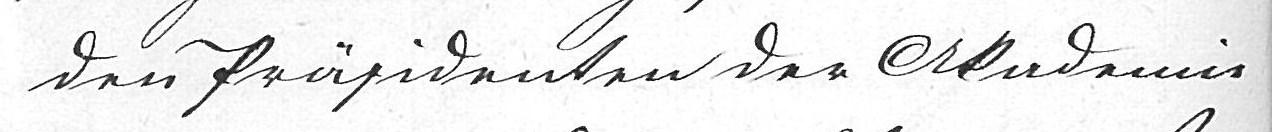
den Präsidenten der Akademie
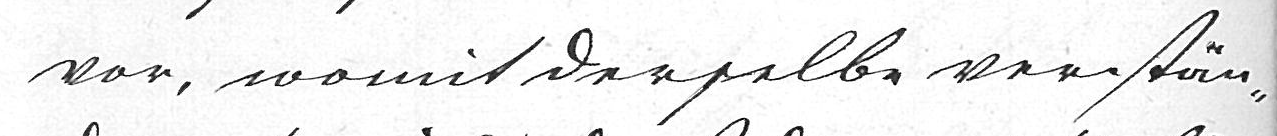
vor, womit derselbe verstän-
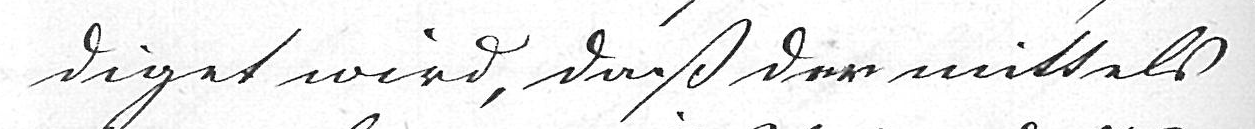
digt wird, daß der mittels
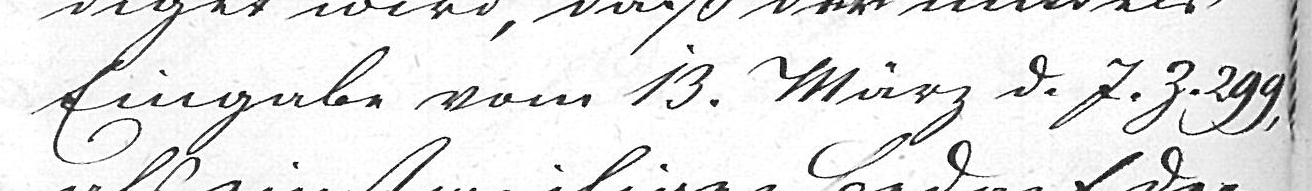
Eingabe vom 13. März d. J. Z. 299,
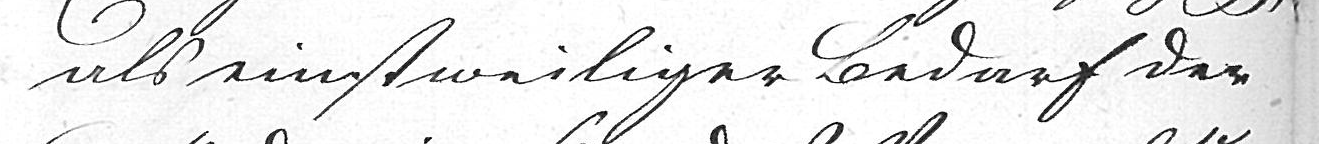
als einstweiliger Bedarf der
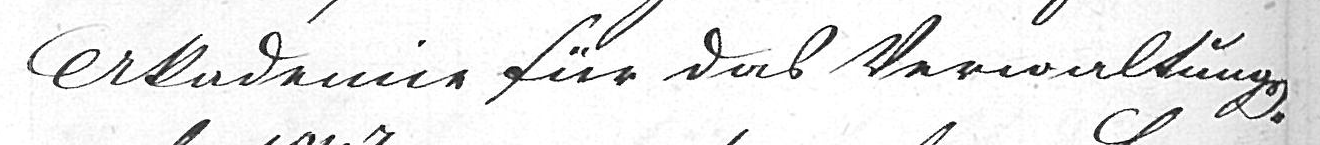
Akademie für das Verwaltungs
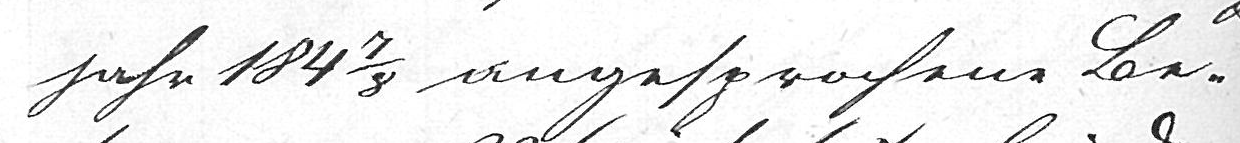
jahr 1847/8 angesprochene Be-
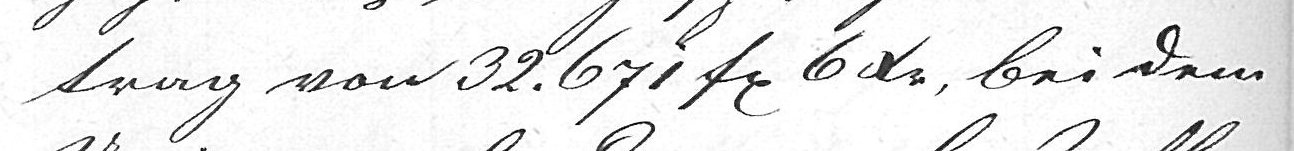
trag von 32.671 fl 6 kr, bei dem
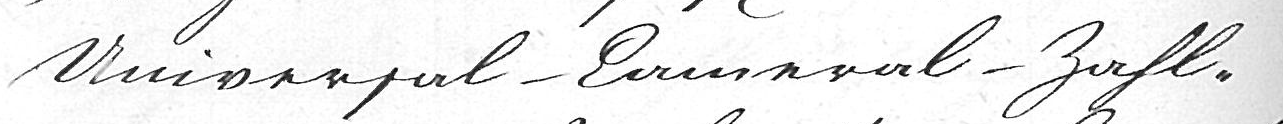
Universal-Cameral-Zahl-
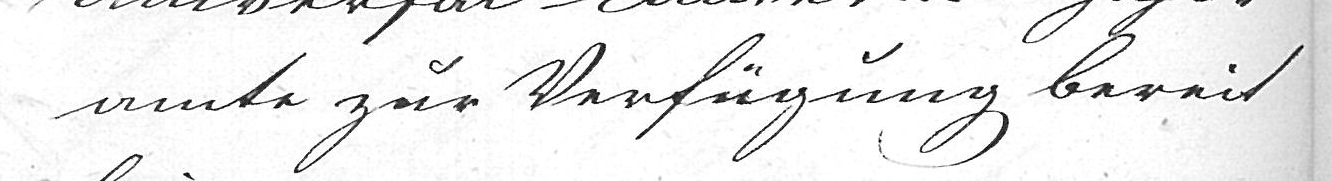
amte zur Verfügung bereit
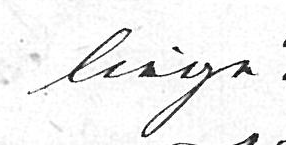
liege
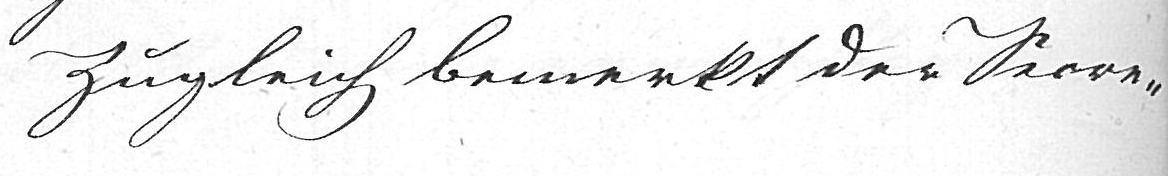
Zugleich bemerkt der Secre-
